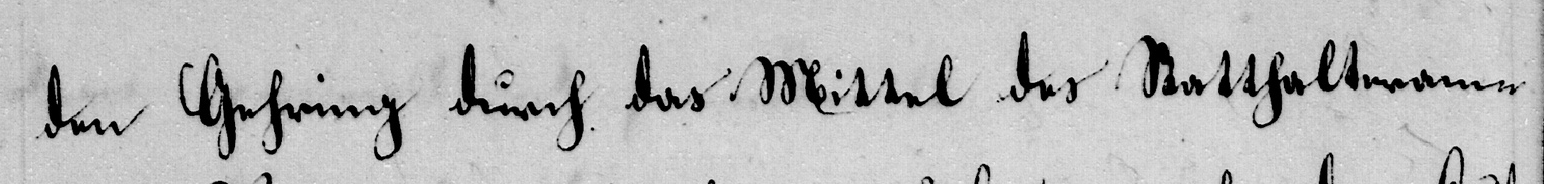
den Gehring durch das Mittel des Statthalteram¬
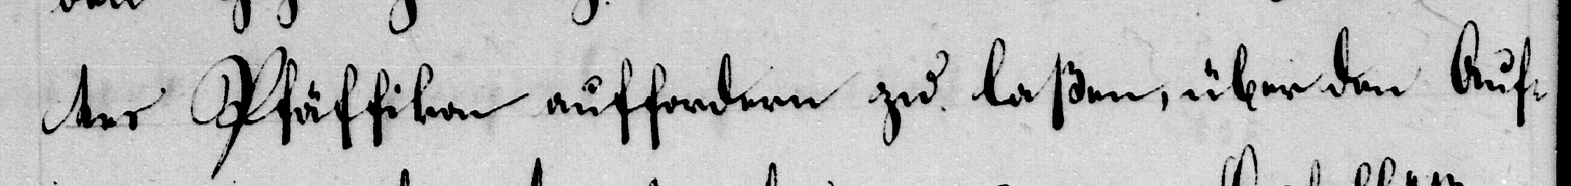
tes Pfäffikon auffordern zu laßen, über den Auf¬
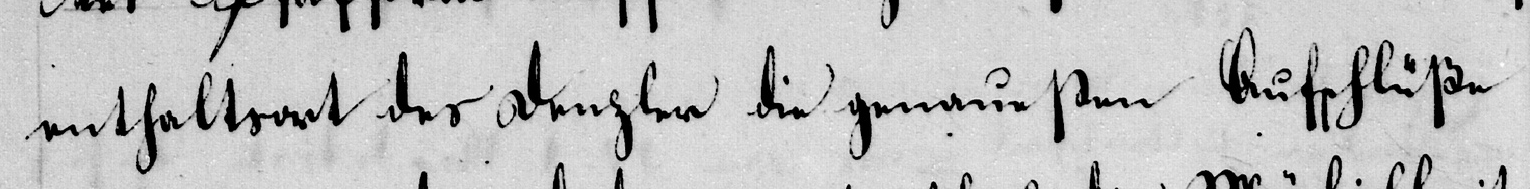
enthaltsort des Denzler die genauesten Aufschlüße
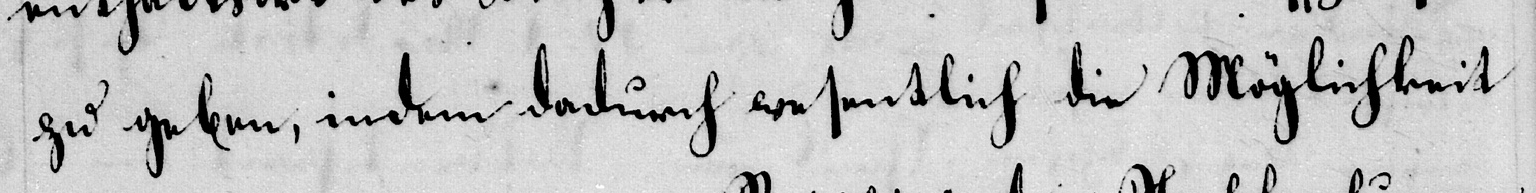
zu geben, indem dadurch wesentlich die Möglichkeit
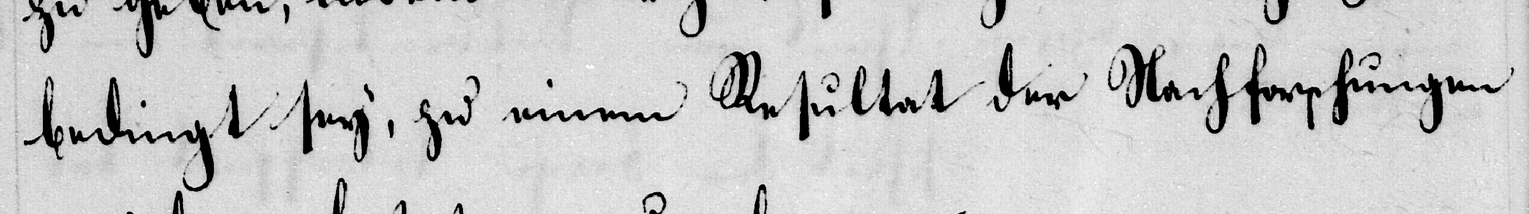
bedingt sey, zu einem Resultat der Nachforschungen
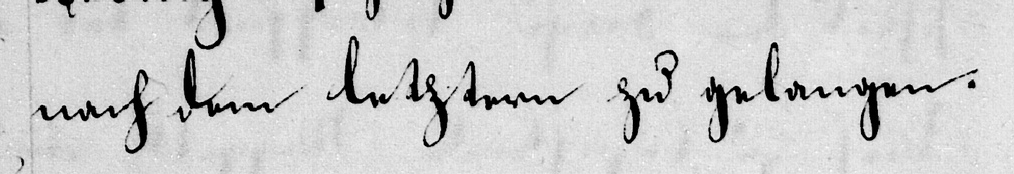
nach dem letztern zu gelangen.
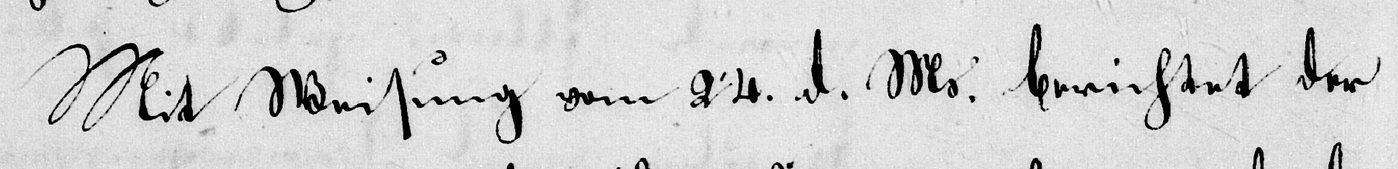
Mit Weisung vom 24. d. Ms. berichtet der
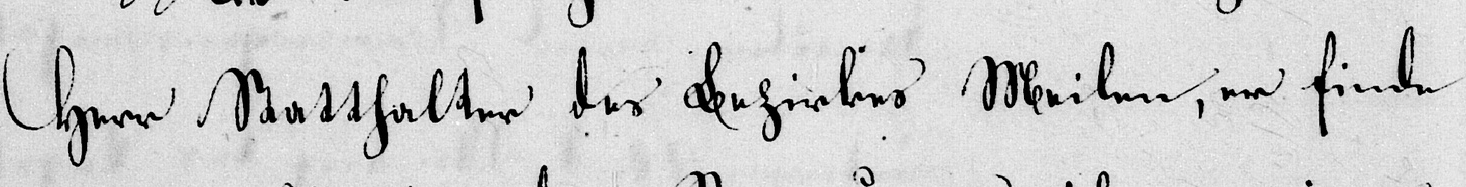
Herr Statthalter des Bezirkes Meilen, er finde
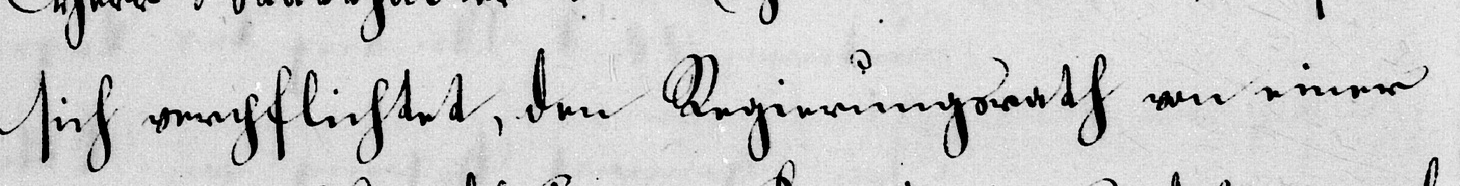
sich verpflichtet, den Regierungsrath von einer
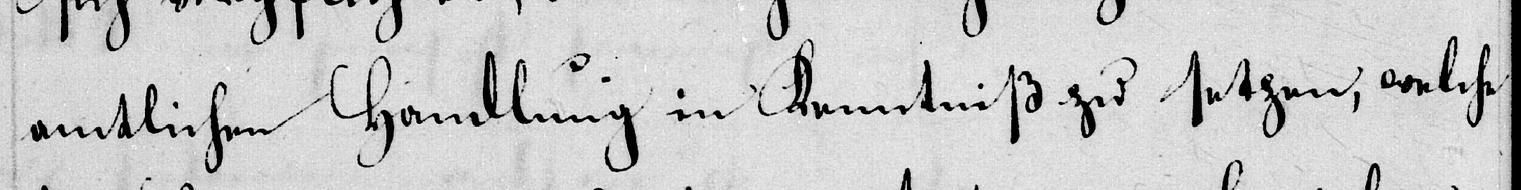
amtlichen Handlung in Kenntniß zu setzen, welche
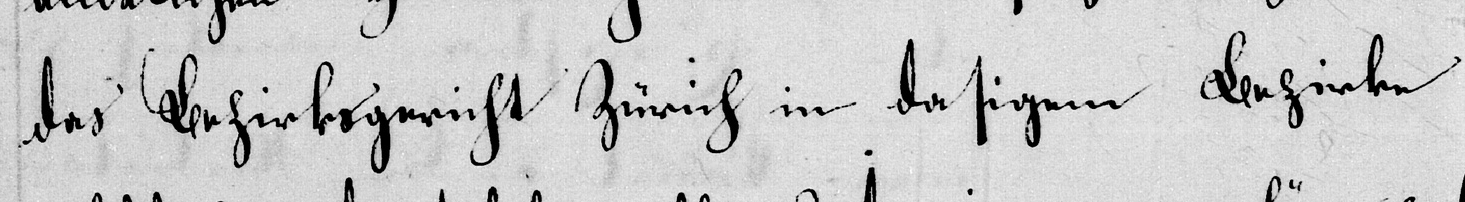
das Bezirksgericht Zürich in dasigem Bezirke
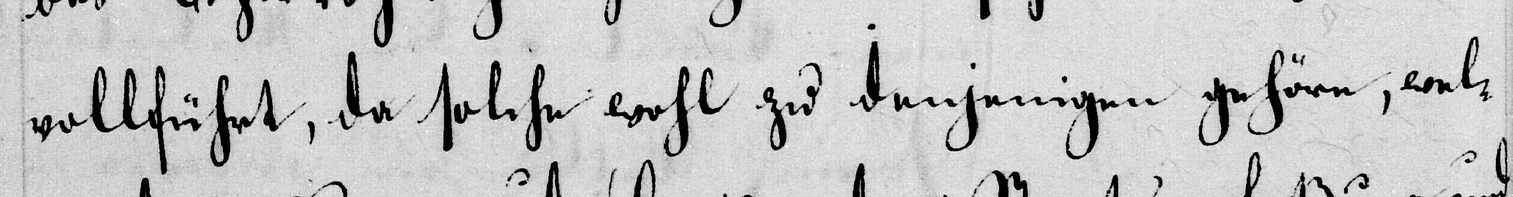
vollführt, da solche wohl zu denjenigen gehöre, wel¬
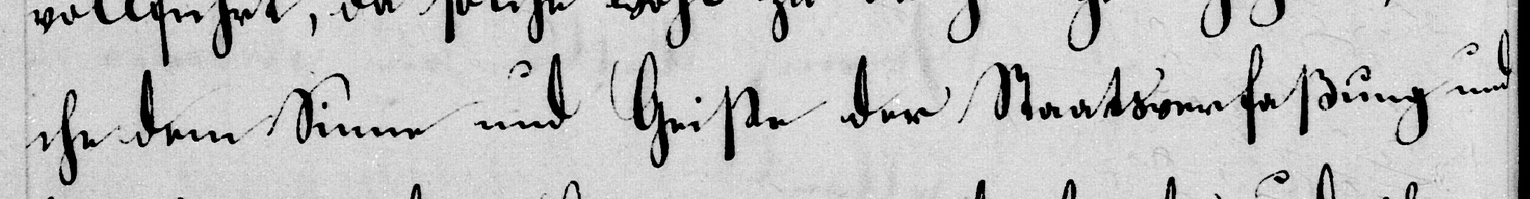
che dem Sinne und Geiste der Staatsverfaßung und
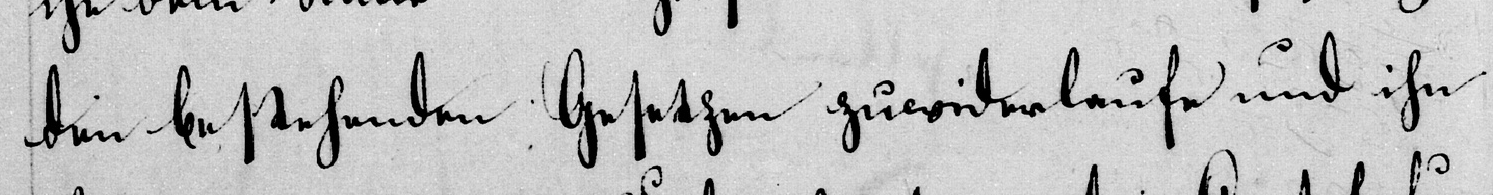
den bestehenden Gesetzen zuwiderlaufe und ihn
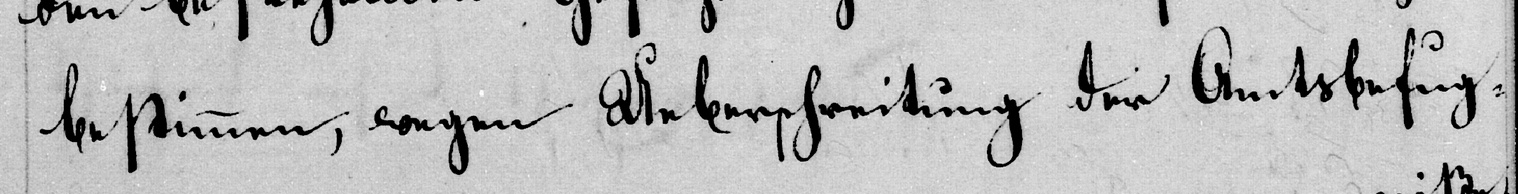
bestimmen, wegen Ueberschreitung der Amtsbefug-
